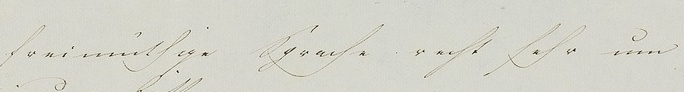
freimüthige Sprache recht sehr um
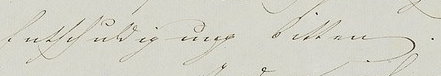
Entschuldigung bitten.
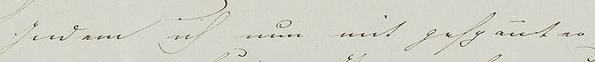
Indem ich nun mit gespannter
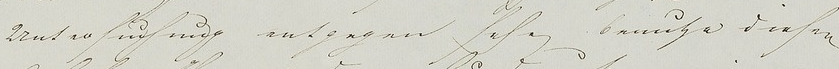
Untersuchung entgegen sehe benutze diesen
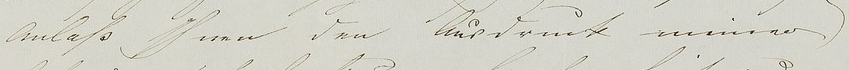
Anlaß Ihnen den Ausdruck meiner
